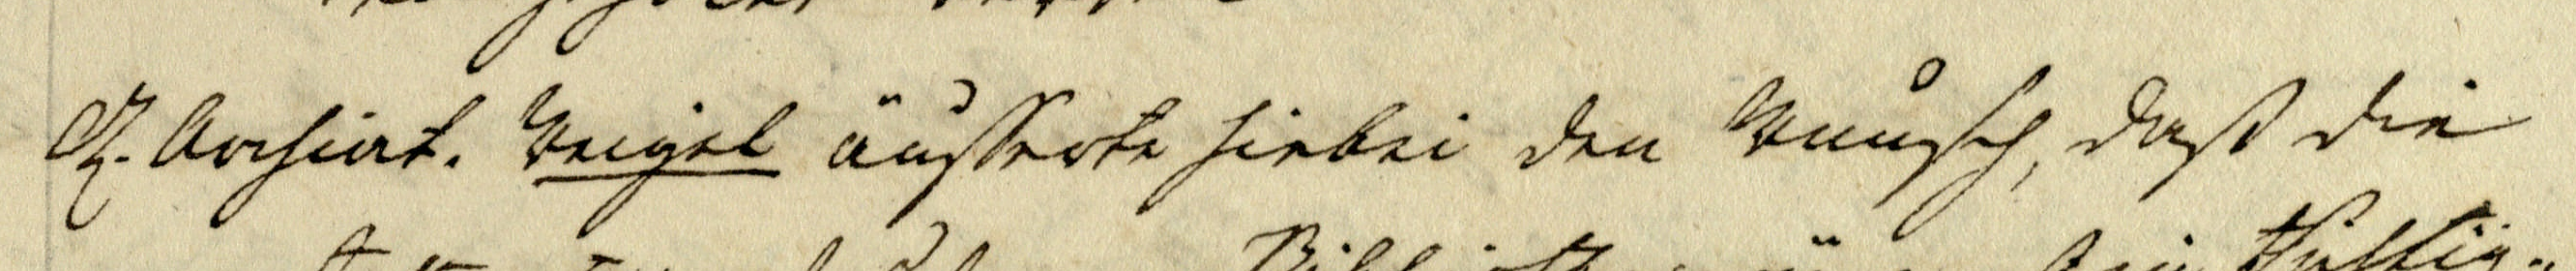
dh. Archiat. Weigel äusserte hiebei den Wunsch, daß die
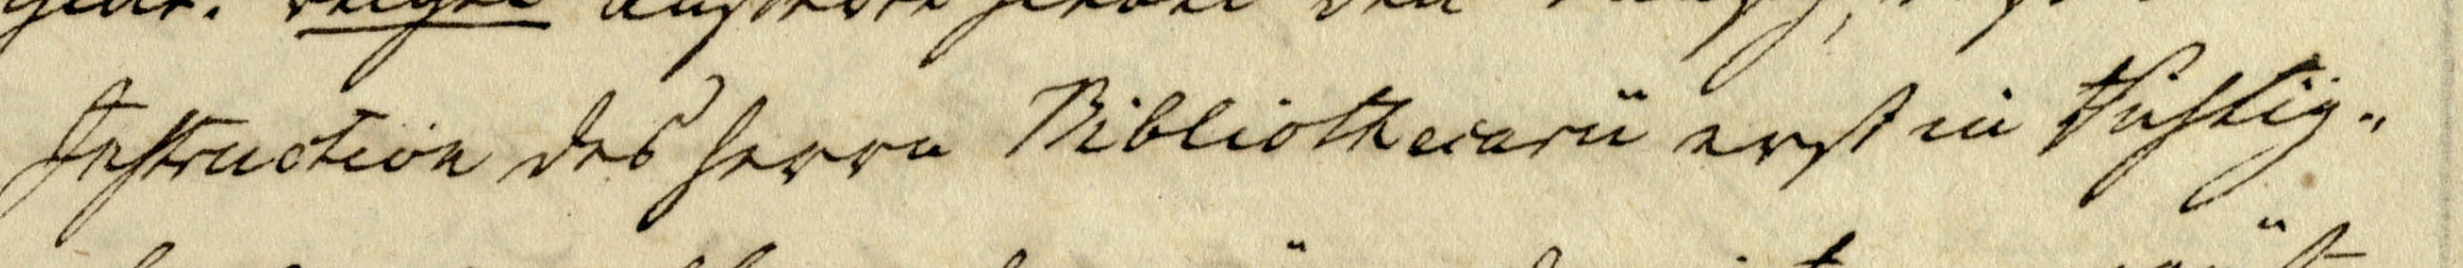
Instruction des Herrn Bibliothecarii erst in Richtig¬
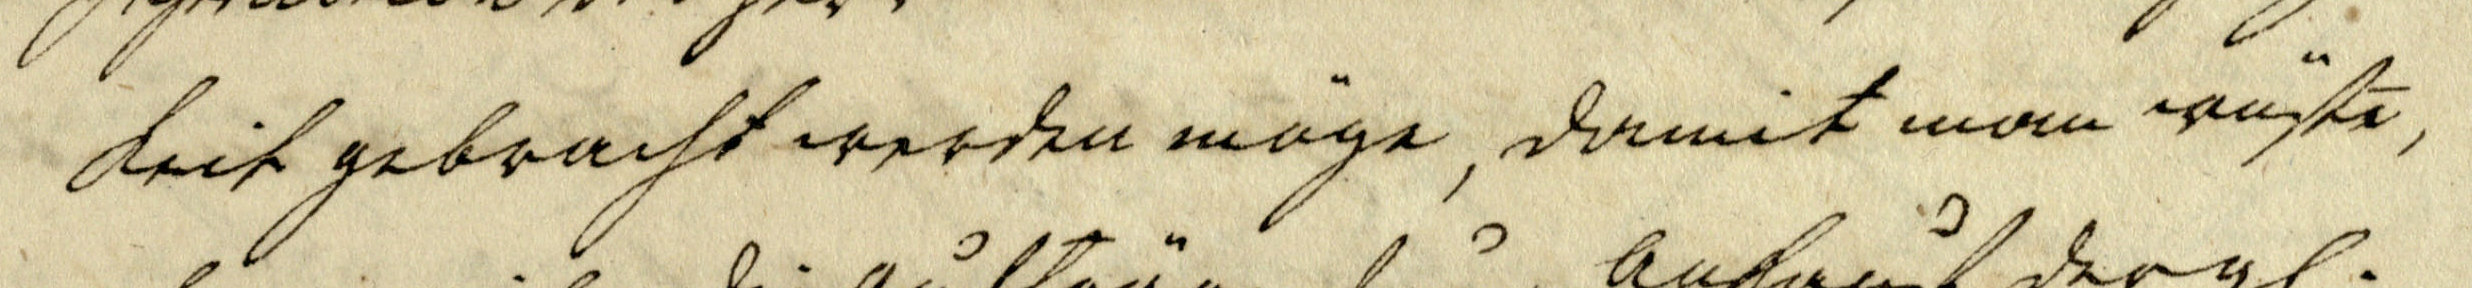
keit gebracht werden möge, damit man wüßte,
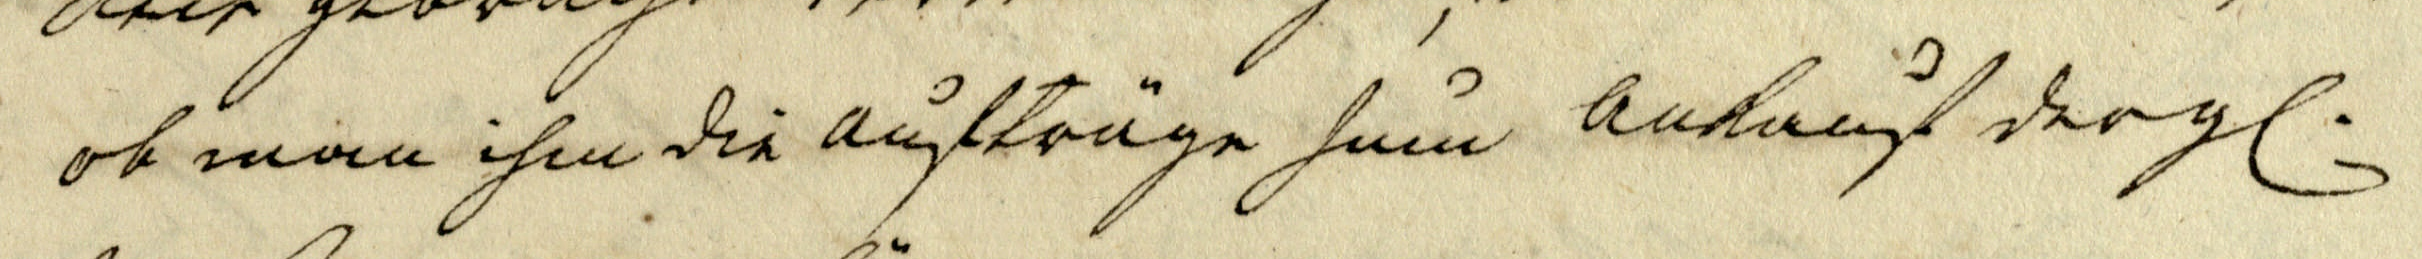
ob man ihm die Aufträge zum Ankauf dergl.
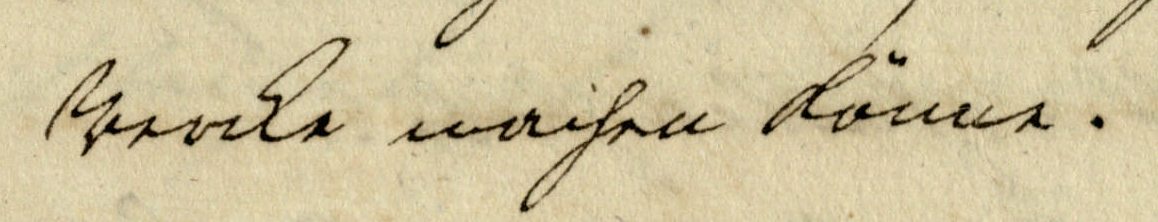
Wercke machen könne.
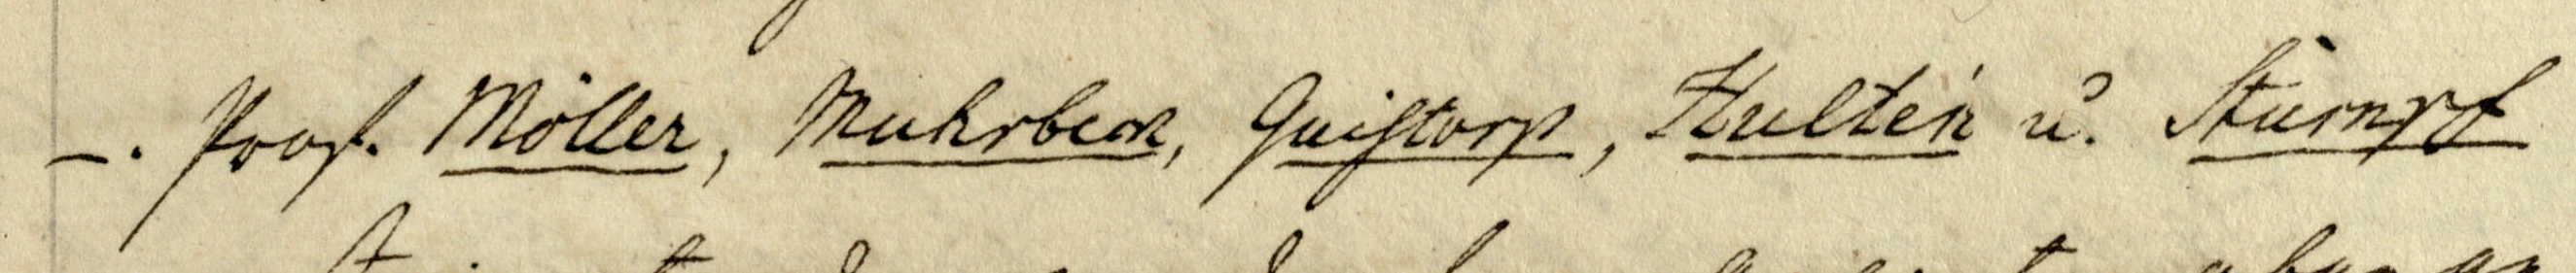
Prof. Möller, Muhrbeck, Quistorp, Hultén u. Stumpf
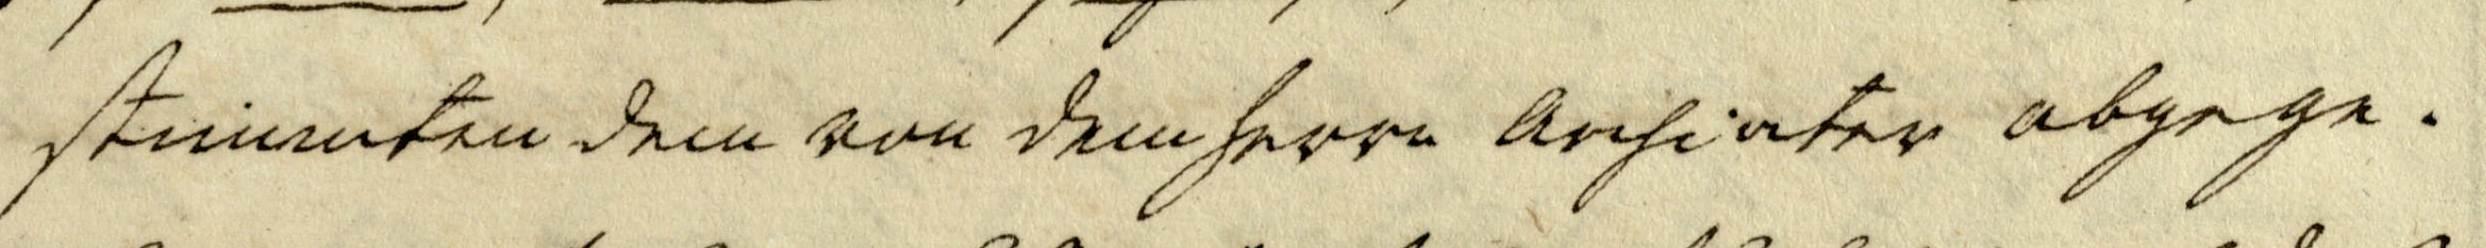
stimmten dem von dem Herrn Archiater abgege¬
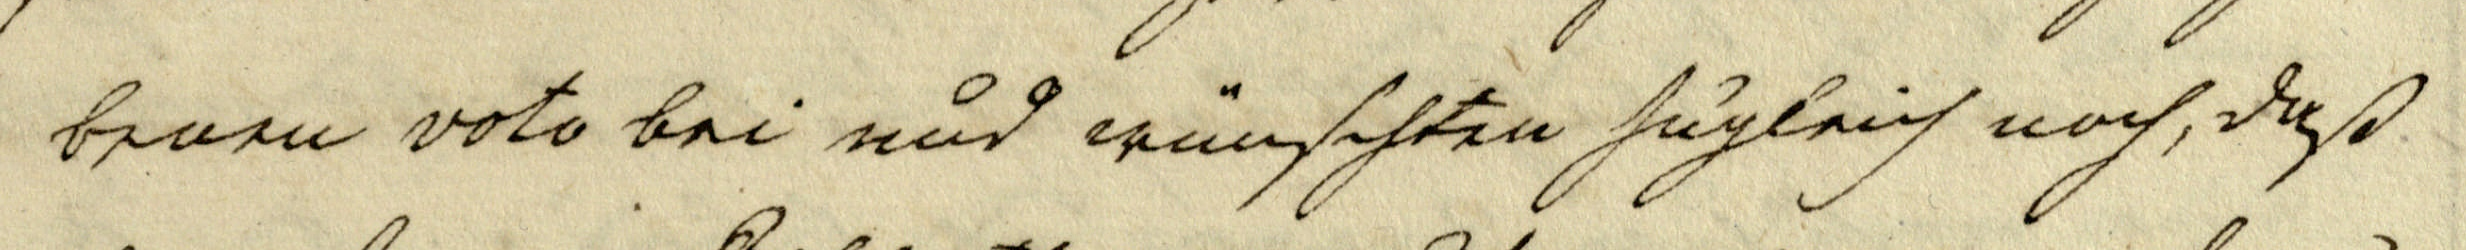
benen voto bei und wünschten zugleich noch, daß
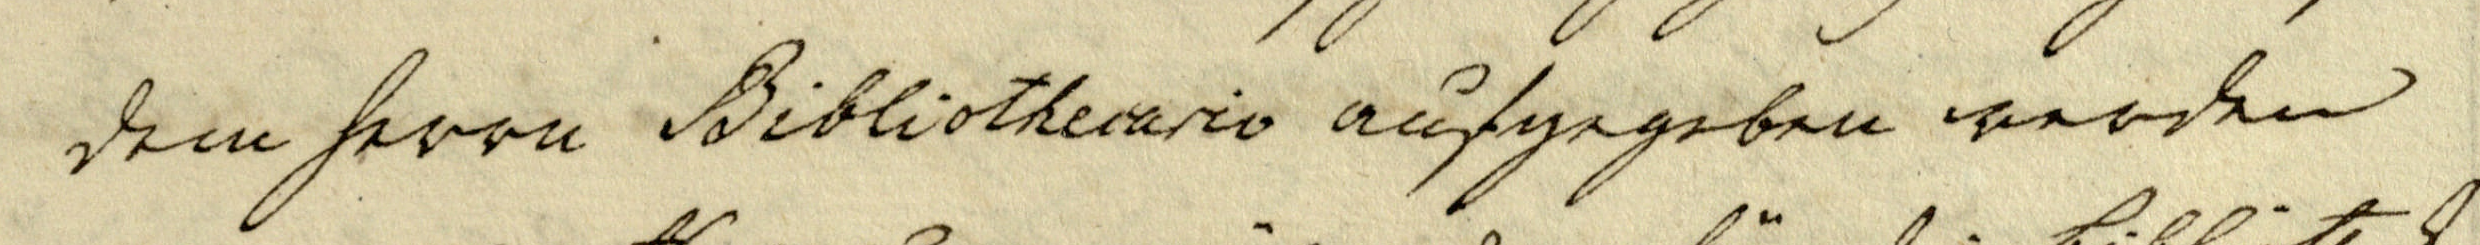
dem Herrn Bibliothecario aufgegeben werden
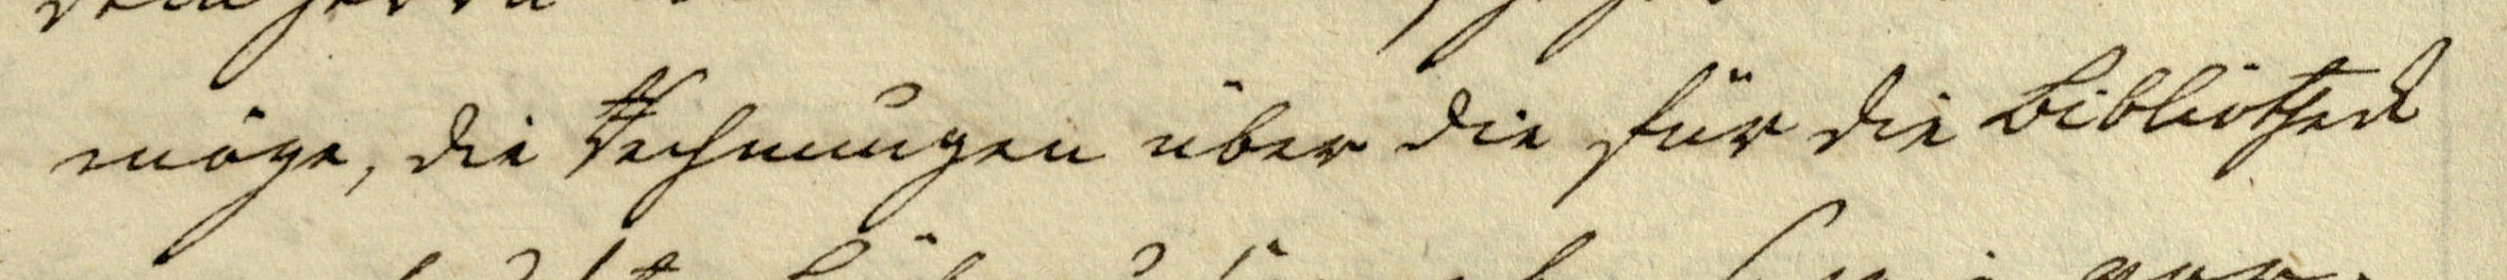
möge, die Rechnungen über die für die Bibliotheck
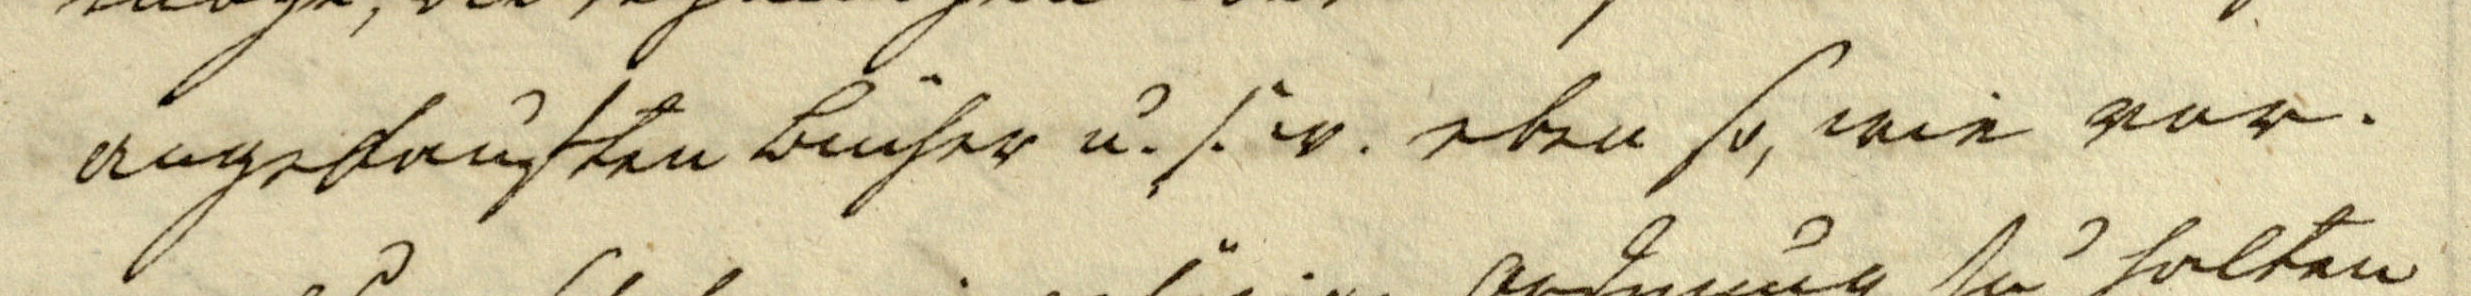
angekauften Bücher u. s. w. eben so, wie vor¬
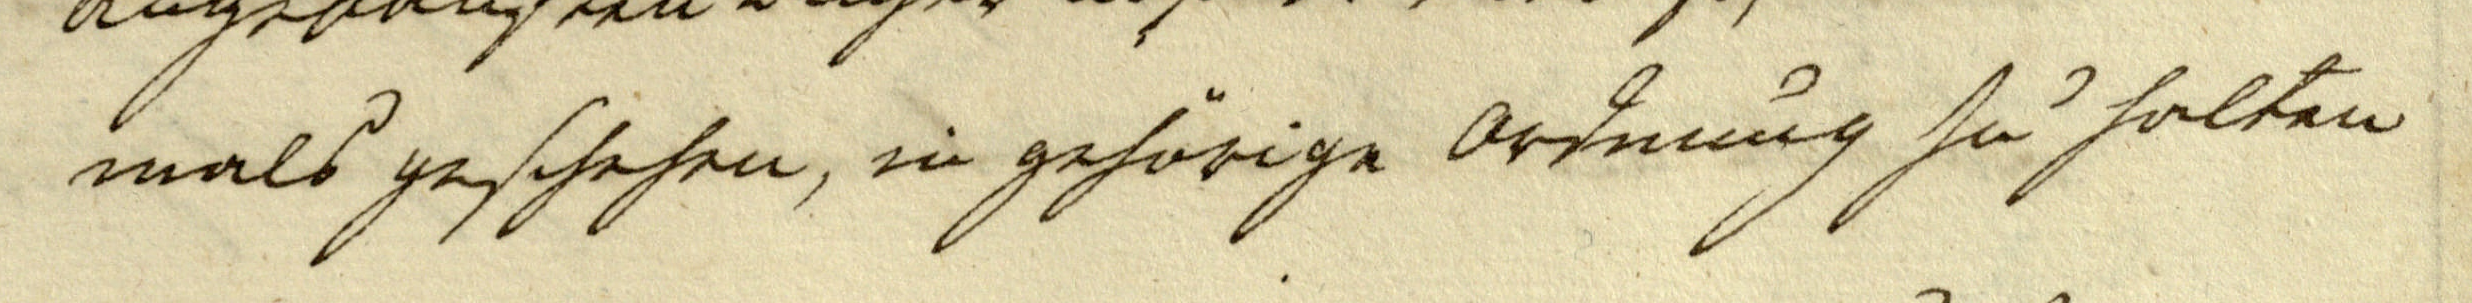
mals geschehen, in gehörige Ordnung zu halten
